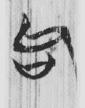句
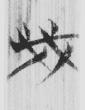{戈戈}
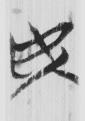𡚦
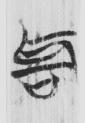{㠯ㅋ}
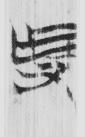拃
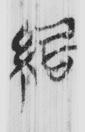{糸己口}
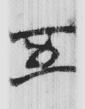五
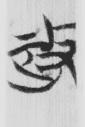政
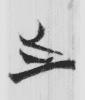之
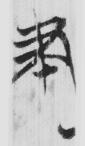聿
